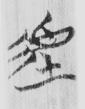𫊟
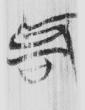{㠯ㅋ}
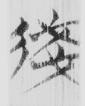{彳戔}
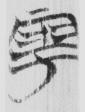𩁹
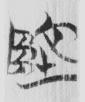地
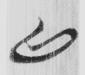㠯（以）
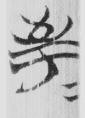{至于}=
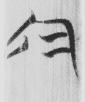今
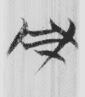凡
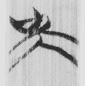吳
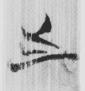之
